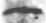一
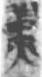翼
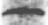一
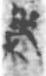杸
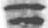二
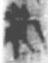旆
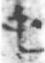屯
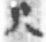八
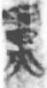翼
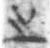之
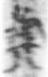○（旗）
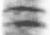二
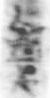○（伐）
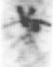戈
